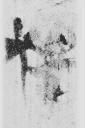{相又}
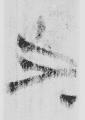之
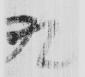九
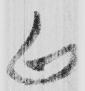㠯（以）
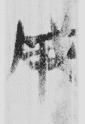成
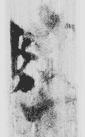地
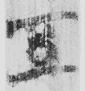五
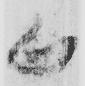㠯（以）
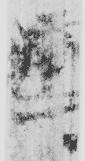{𨟻止}
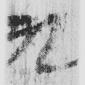九
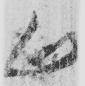㠯（以）
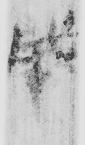成
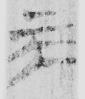天
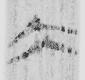六
